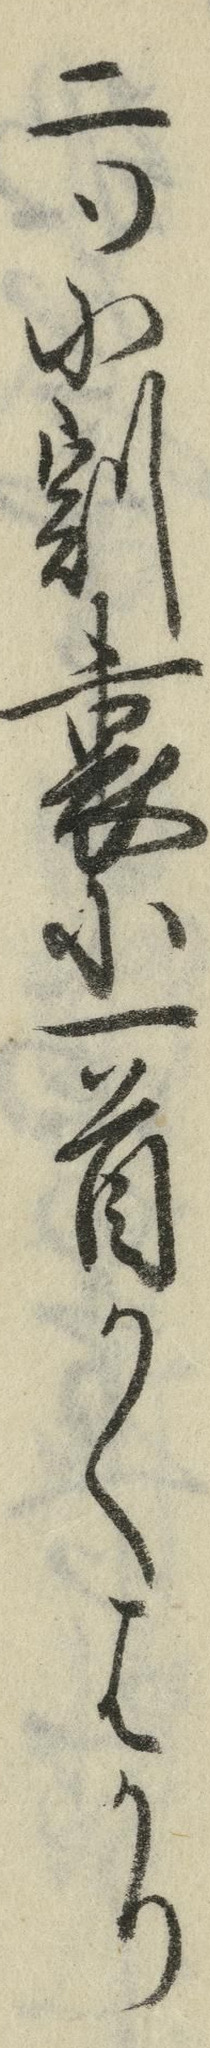二ツに割裏に一首かくはかり
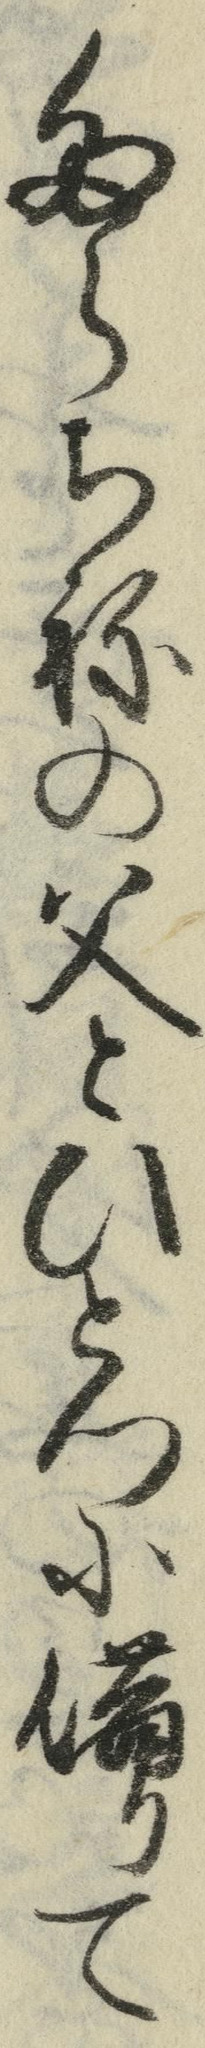たらちねの父とひとつに備
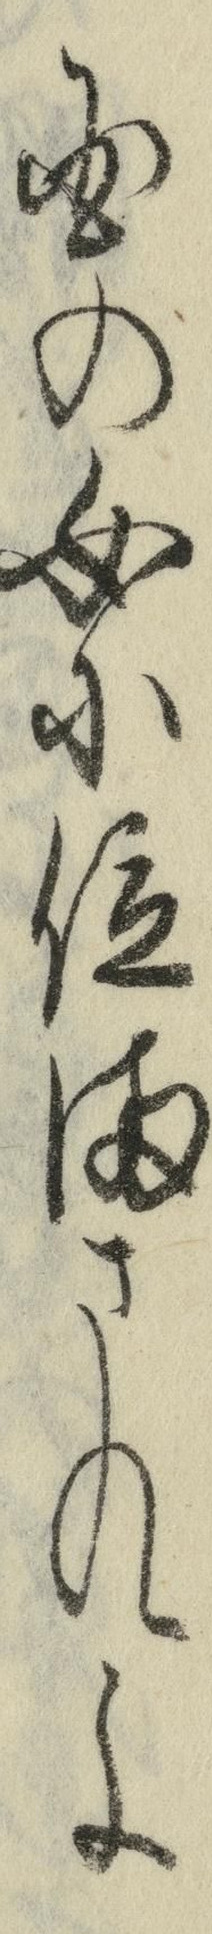国の女に位まされよ
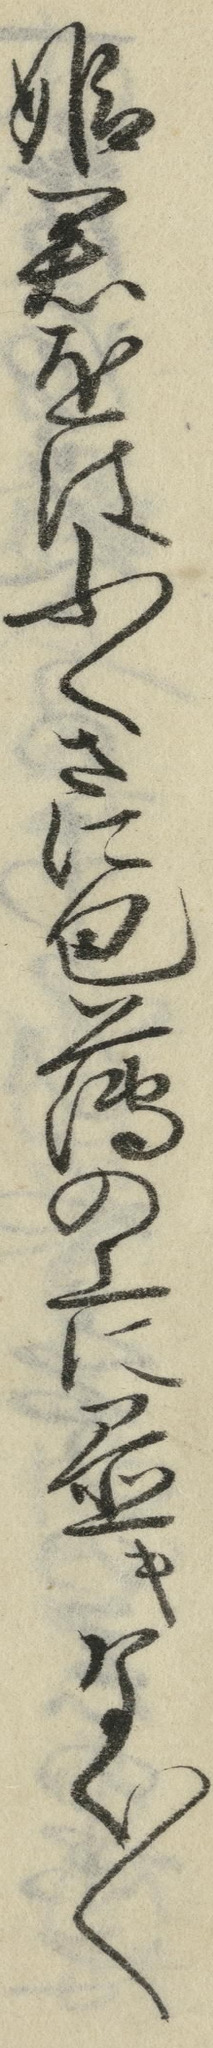姫君をはふくさに包薄の上に置く〳〵
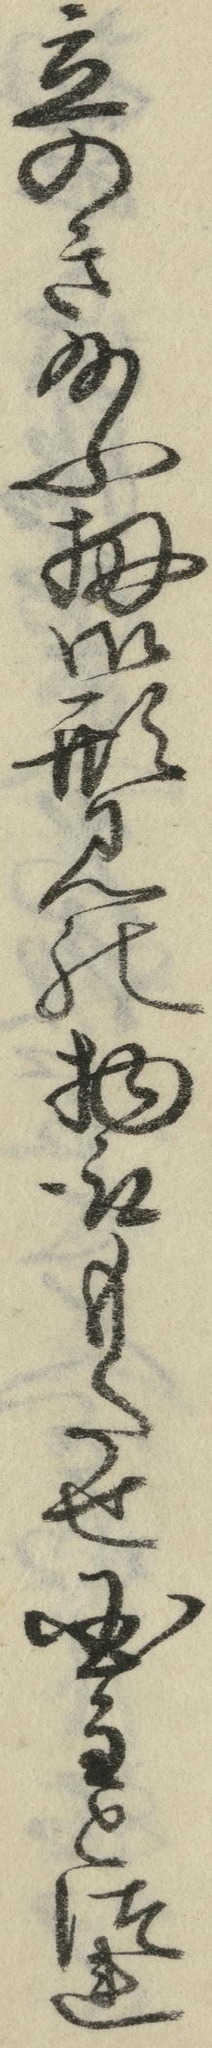立のき給ふ扨御形見の物取もたせ国主とつれ
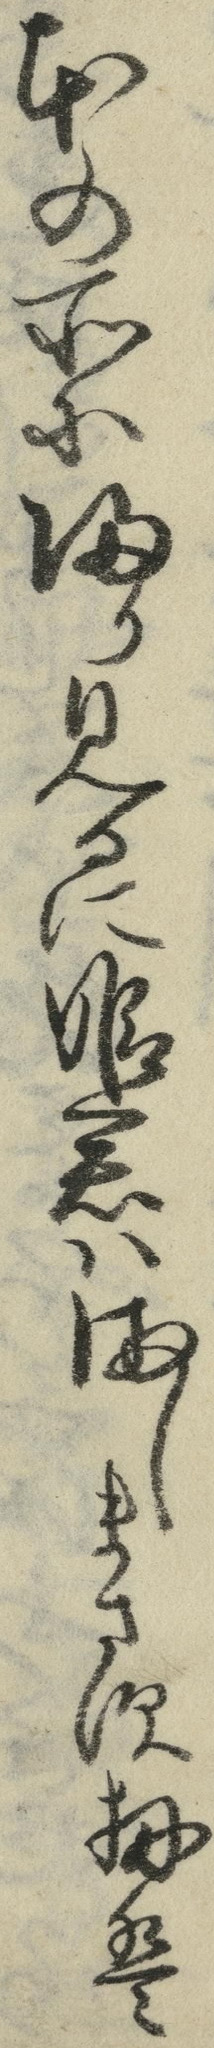本の所に帰見るに姫君はましまさす扨は
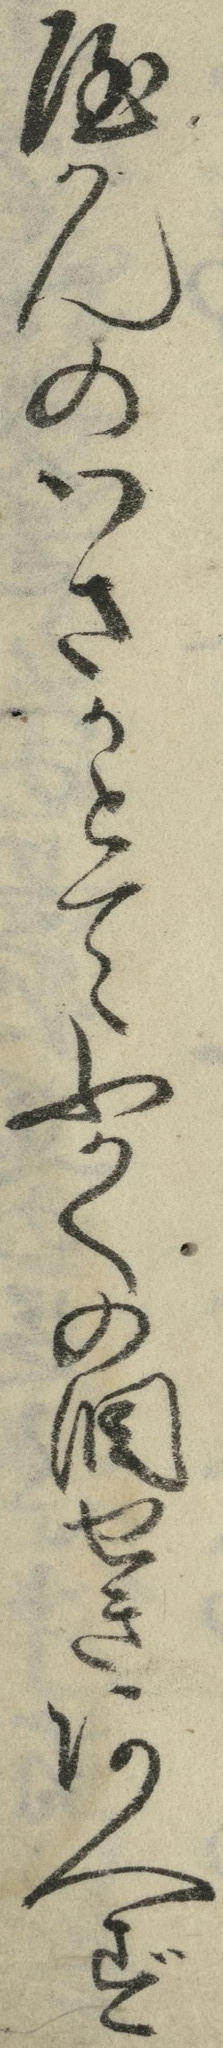やかんのわさかとてふかくの泪せきあへず

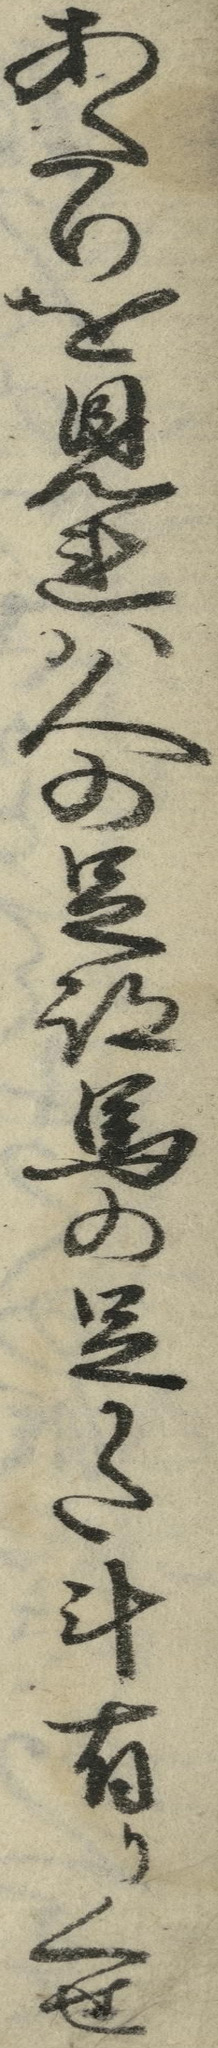あたりを見れハ人の足跡馬の足かた斗有
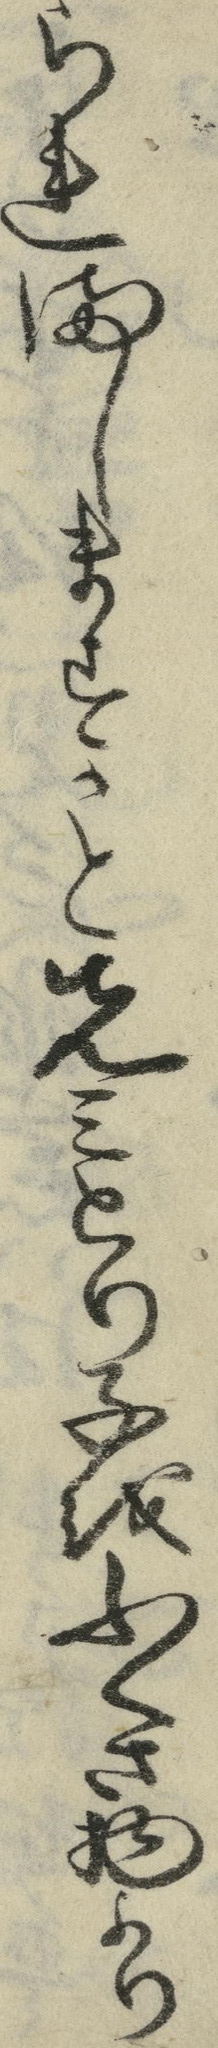られましますかと先ミとり子をふくさ物より
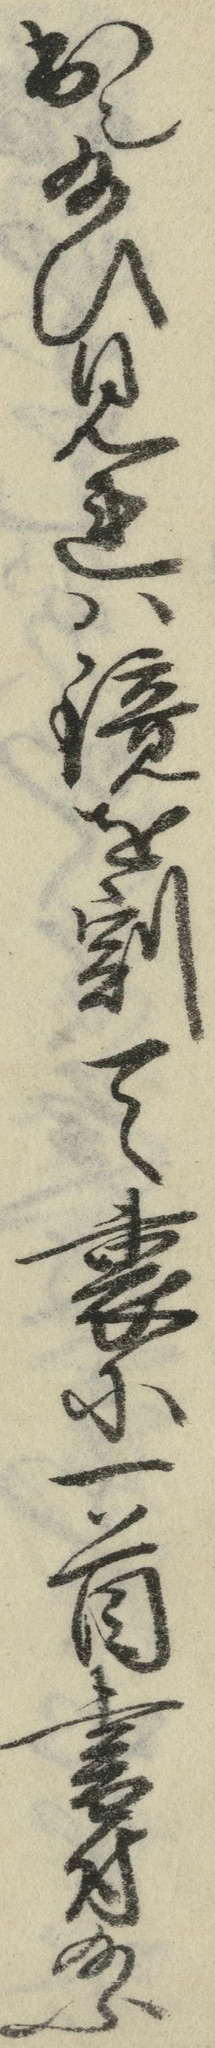出シ給ひ見れハ鏡を割て裏に一首書付給ふ
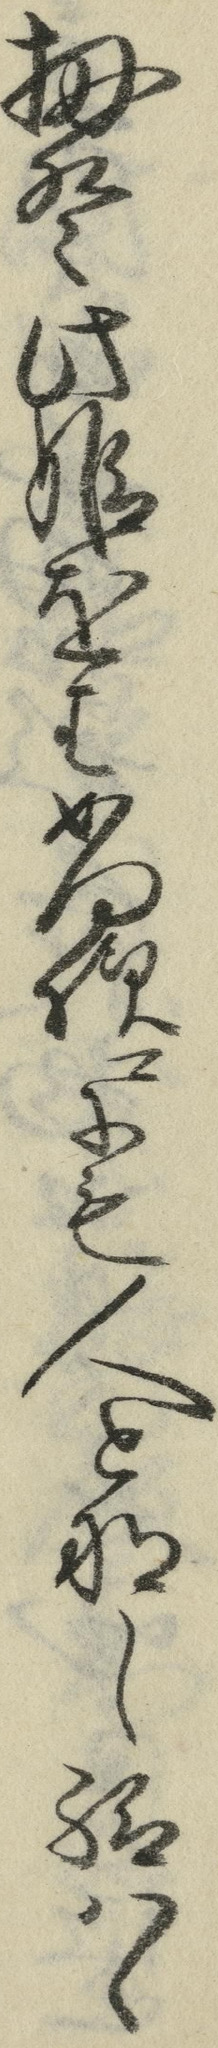扨は此姫をは如何様人となし給ハゝ
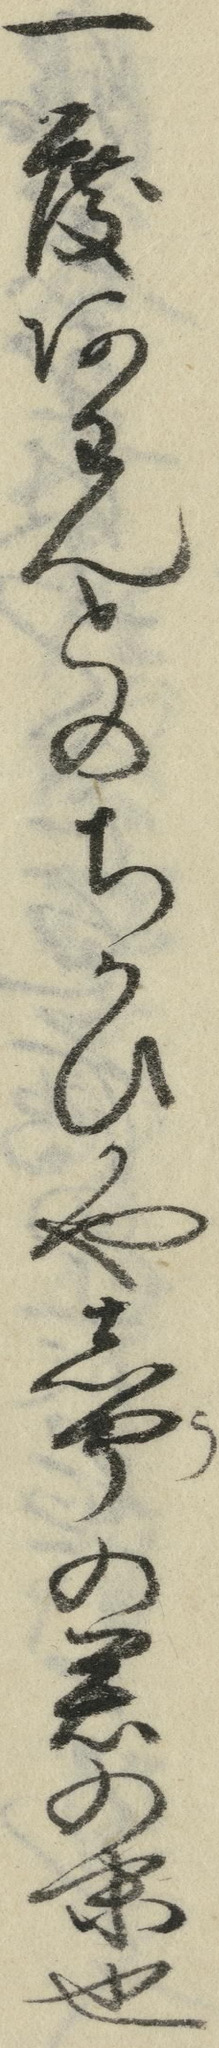一度あわんとのちかひかやしやううの君の末也
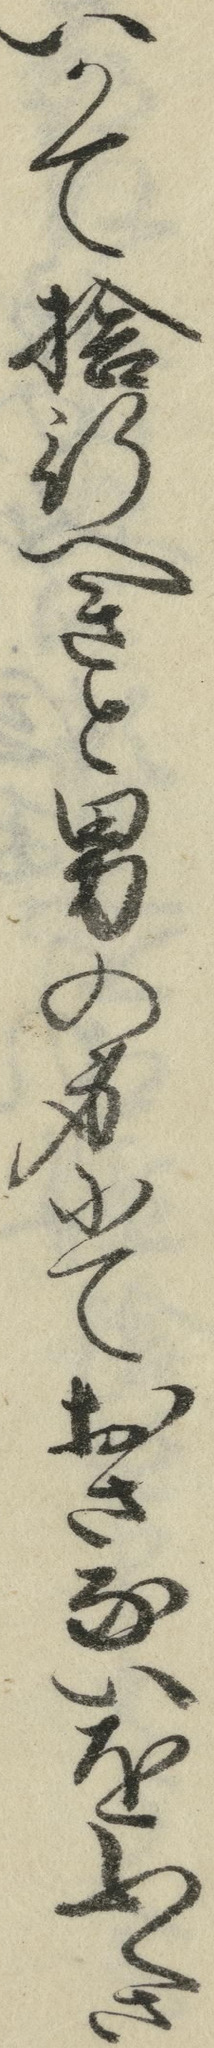いかて捨行へきと男の身にておさないをふくさ
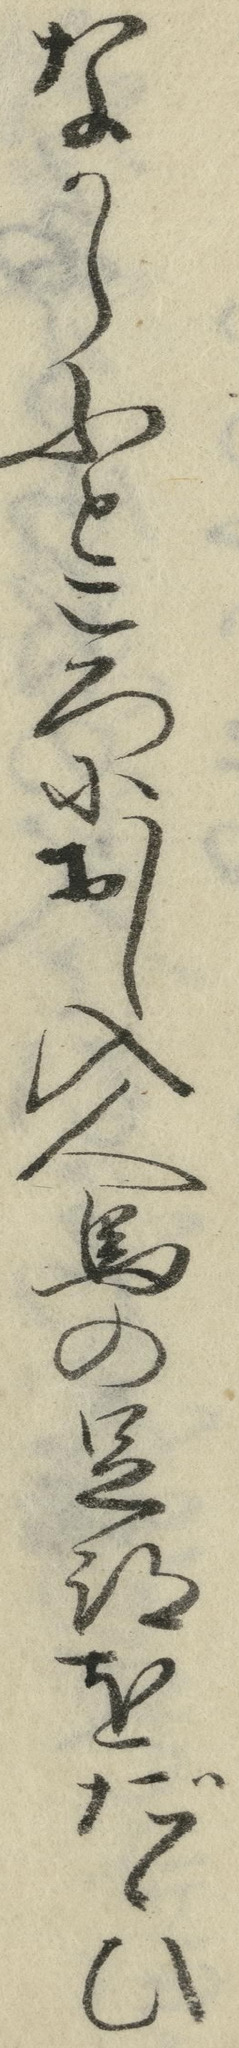なからふところにおし入人馬の足跡をだゝひ
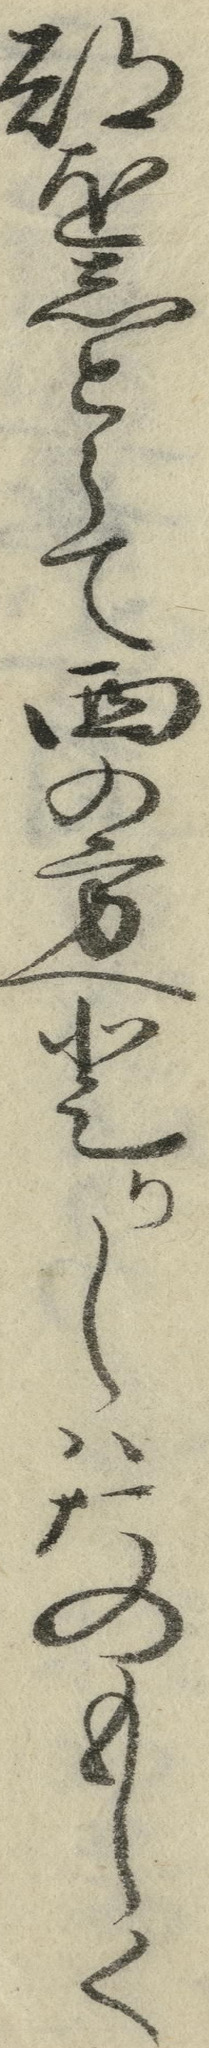跡をしとうて西の方へ登
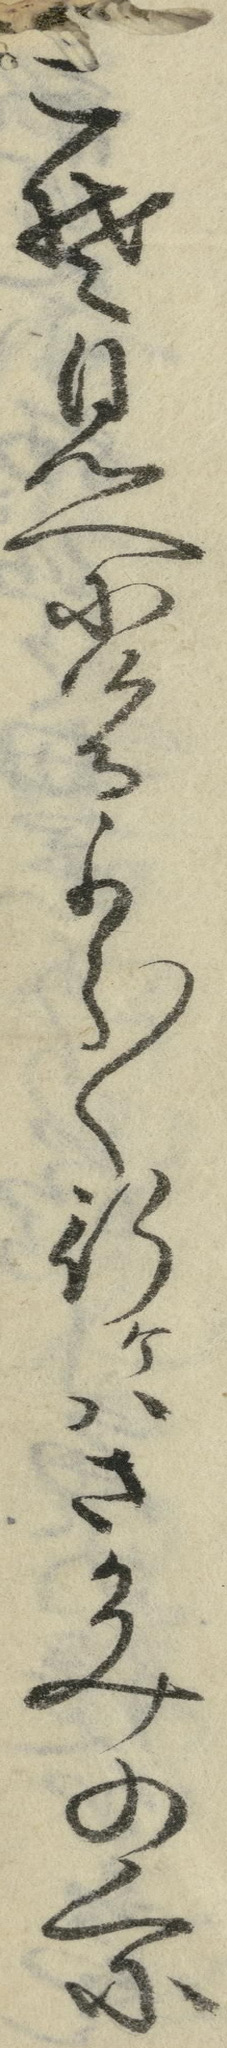こそ見へにけるよう〳〵行
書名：浅間記
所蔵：東京大学地震研究所図書室 Earthquake Research Institute Library, The University of Tokyo, JAPAN
